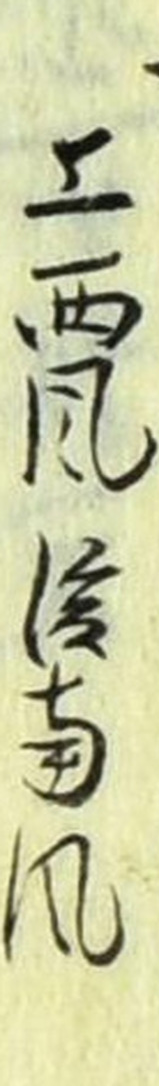上西風後南風
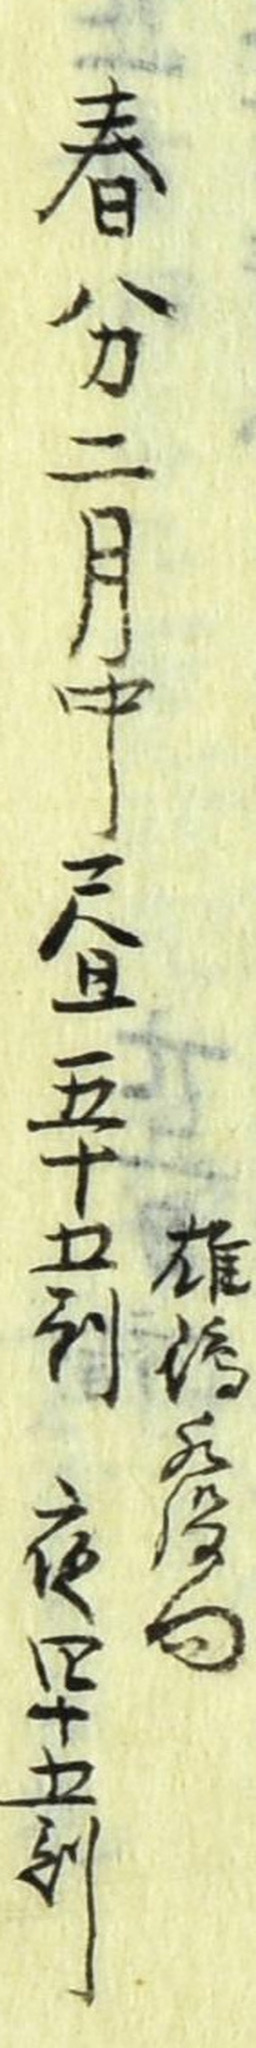春分二月中昼五十五刻夜四十五刻

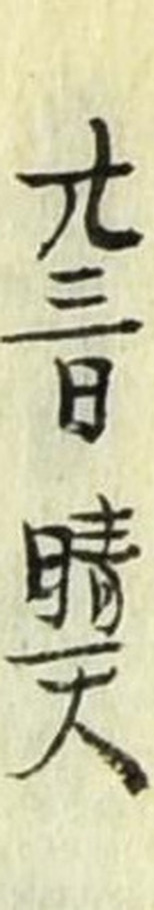廿三日晴天
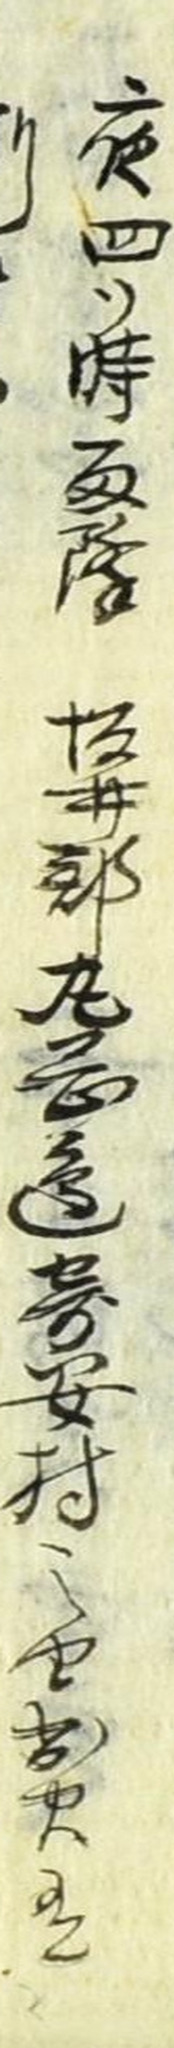夜四ツ時雨降坂井郡丸岡辺寄安村之由出火有
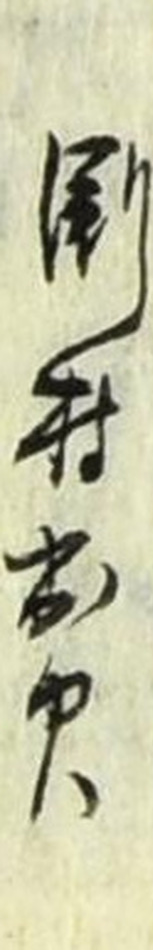淵村出火
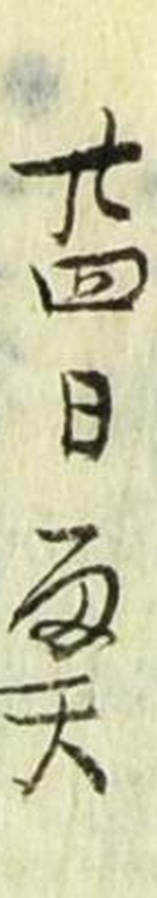廿八日雨天
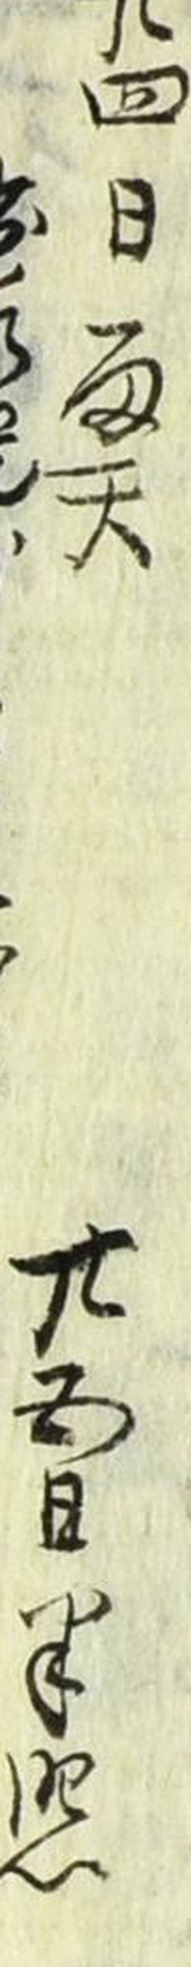廿四日雨天廿五日半照
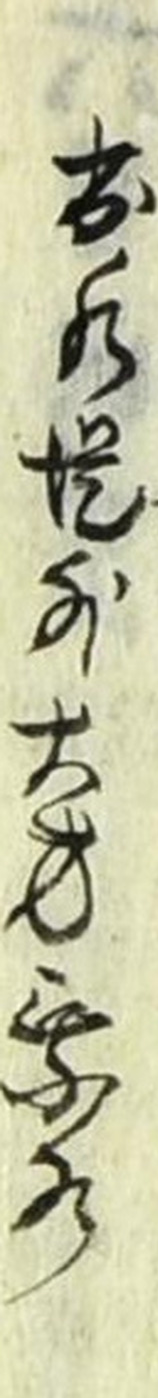出水堤外大方乗水
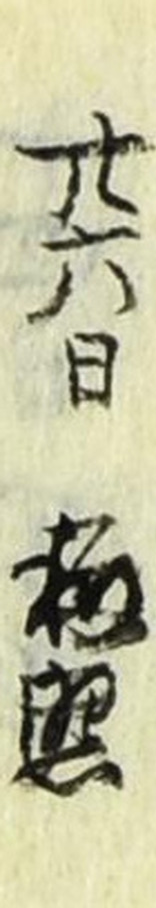廿八日雨天
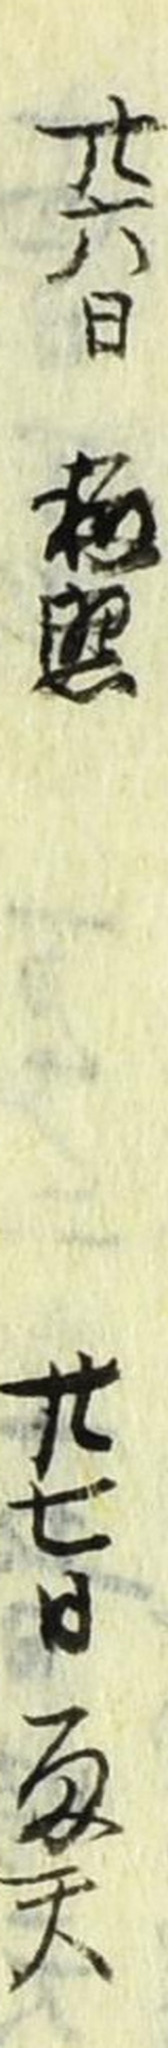廿六日和照廿七日雨天
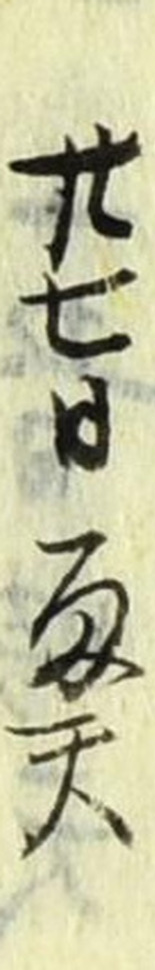廿八日雨天
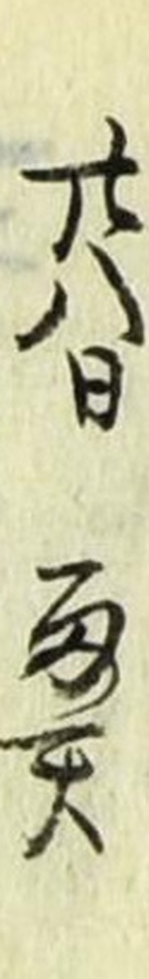廿八日雨天
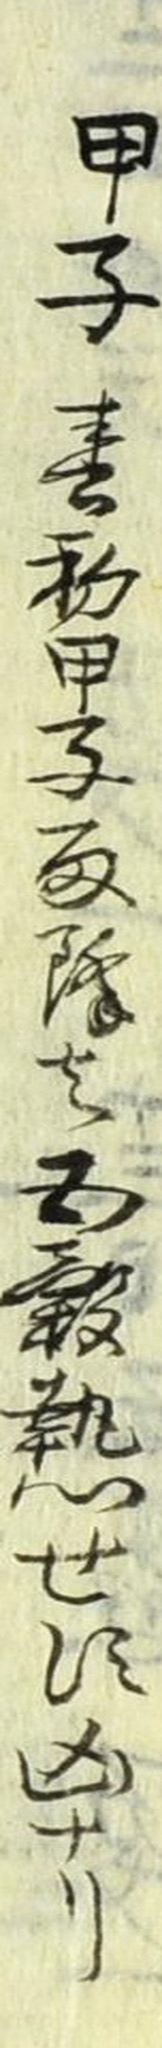甲子春初甲子雨降者五穀熱せす凶ナリ
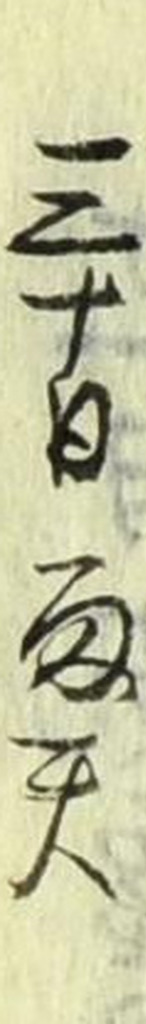廿八日雨天
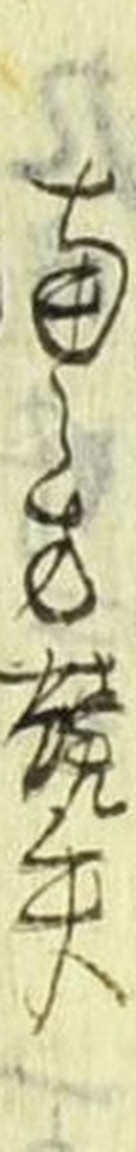南之方焼失
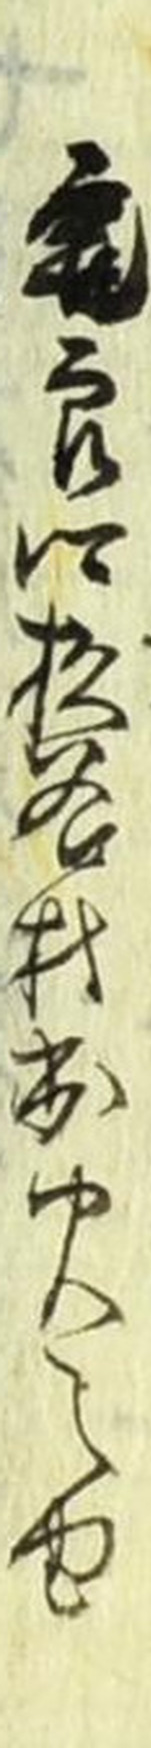宅良郷杉谷村出火之由
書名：（日記）
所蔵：福井県文書館 Fukui Prefectural Archives
